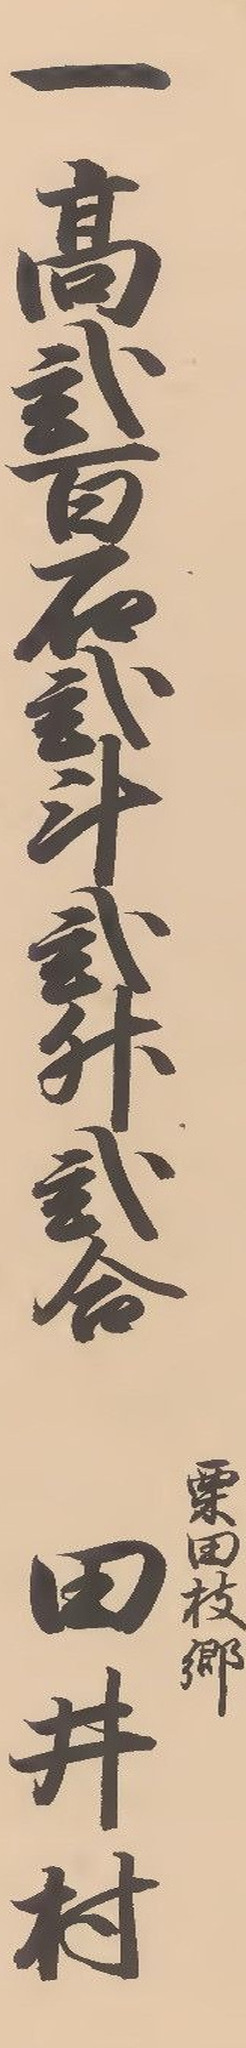一高弐百石弐斗弐升弐合田井村
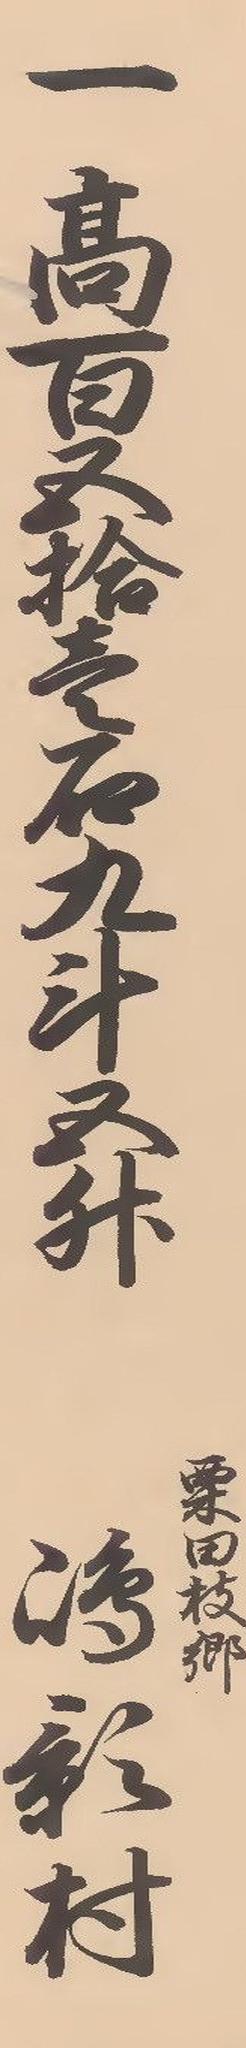一高百五拾壱石九斗五升嶋影村

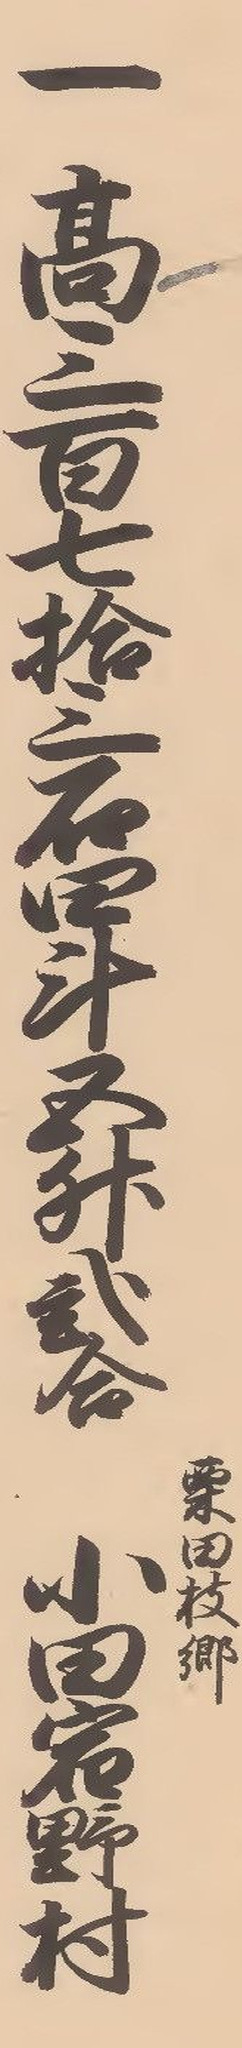一高三百七拾三石四斗五升弐合小田宿野村
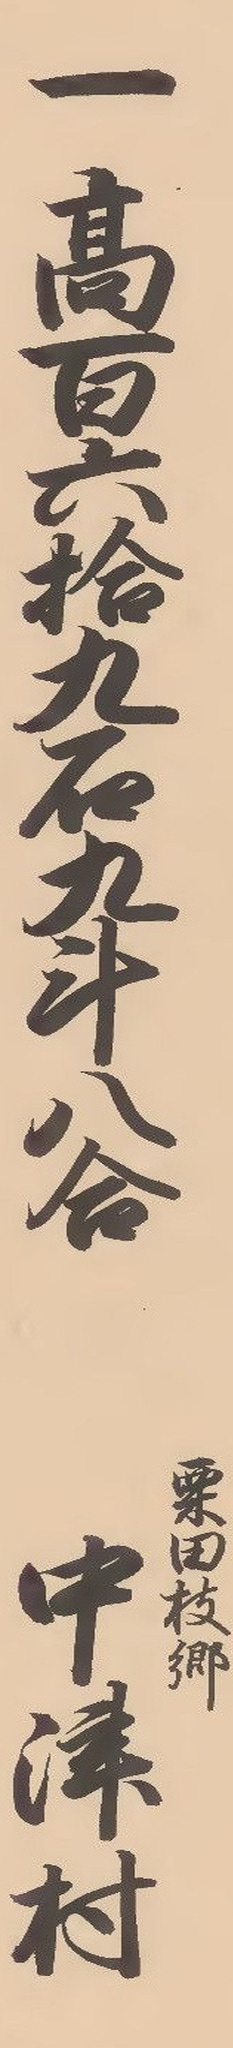一高百六拾九石九斗八合中津村
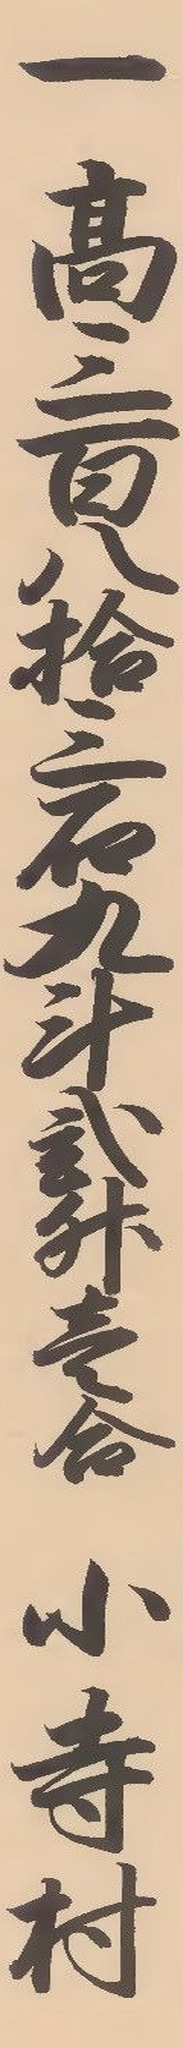一高三百八拾三石九斗弐升壱合小寺村
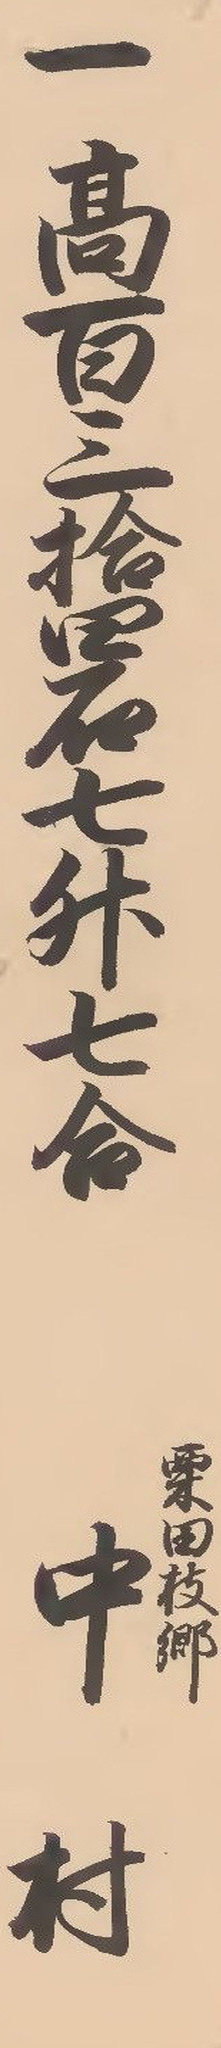一高百三拾四石七升七合中村
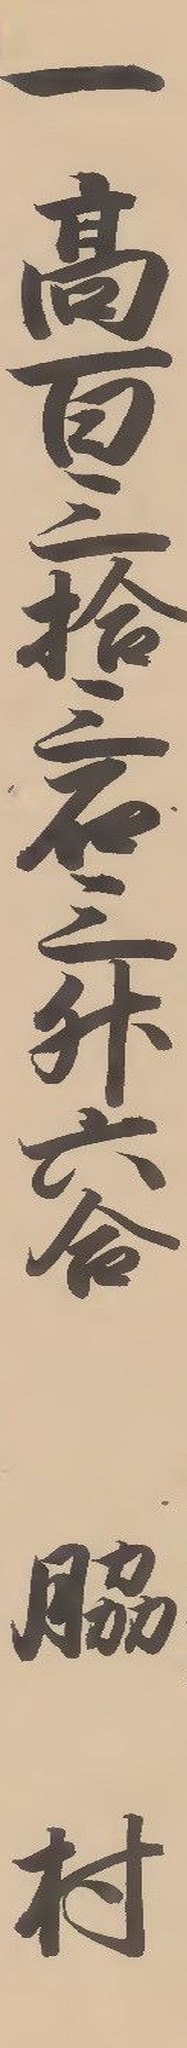一高百三拾三石三升六合脇村
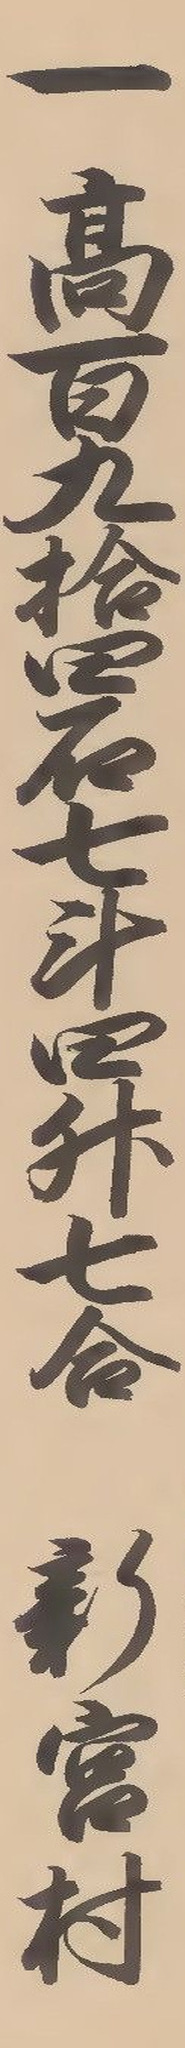一高百九拾四石七斗四升七合新宮村
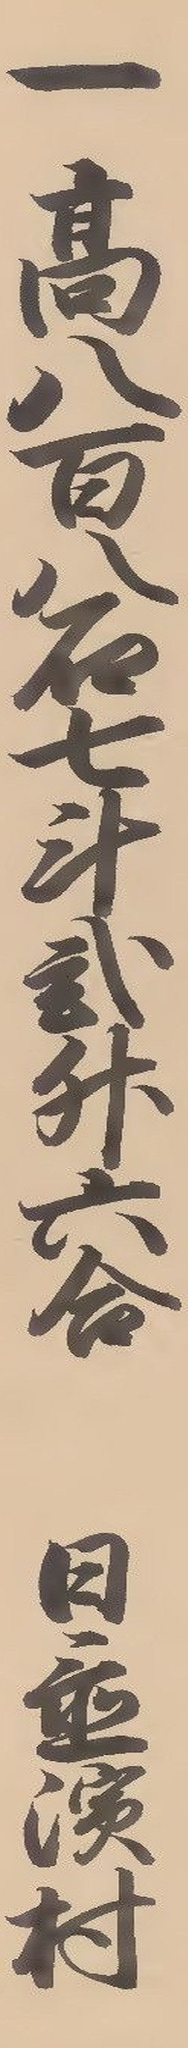一高八百八石七斗弐升六合日置浜村
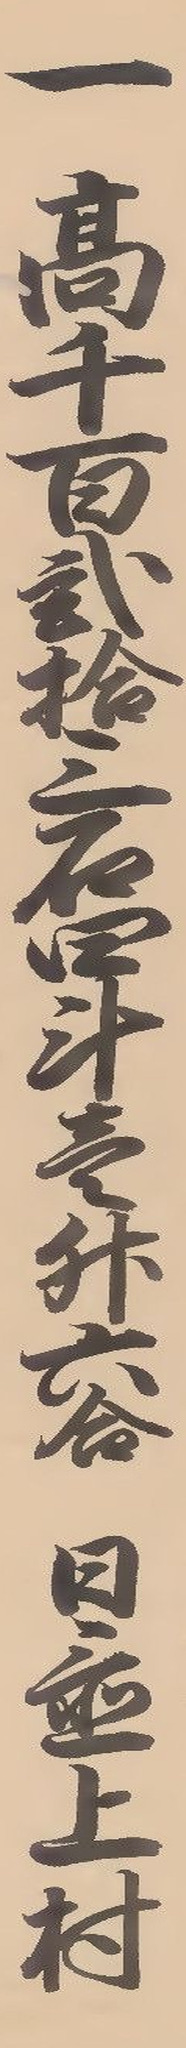一高千百弐拾三石四斗壱升六合日置上村

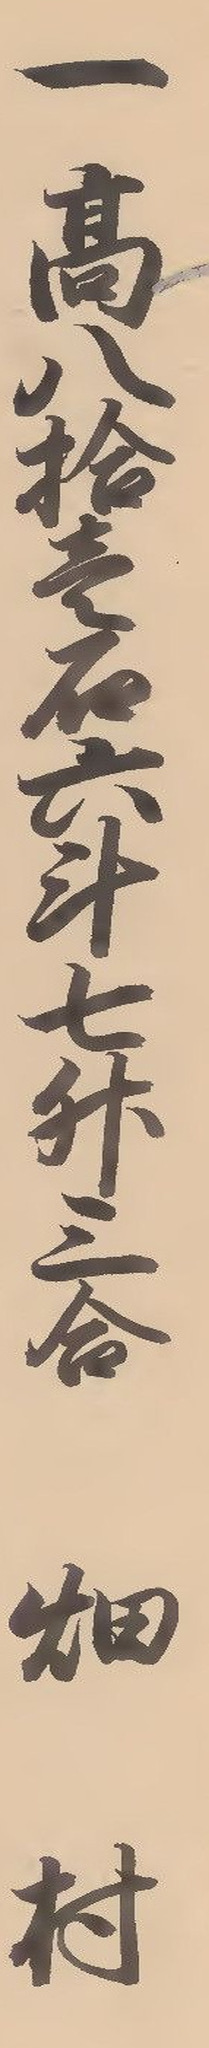一高八拾壱石六斗七升三合畑村
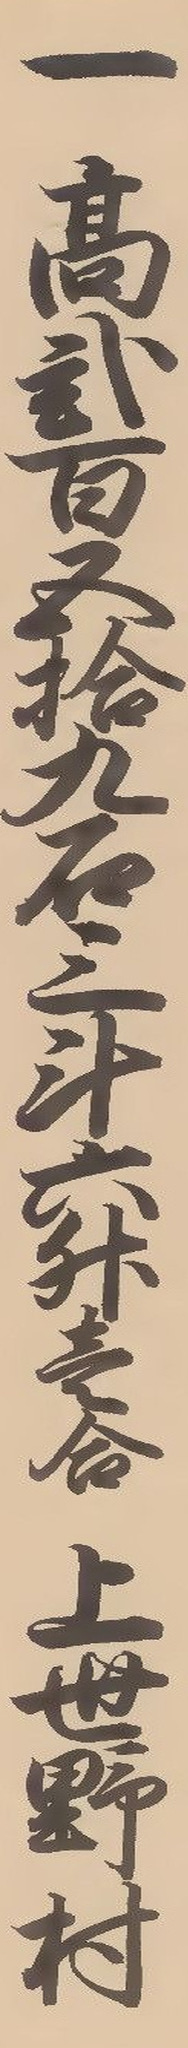一高弐百五拾九石三斗六升壱合上世野村
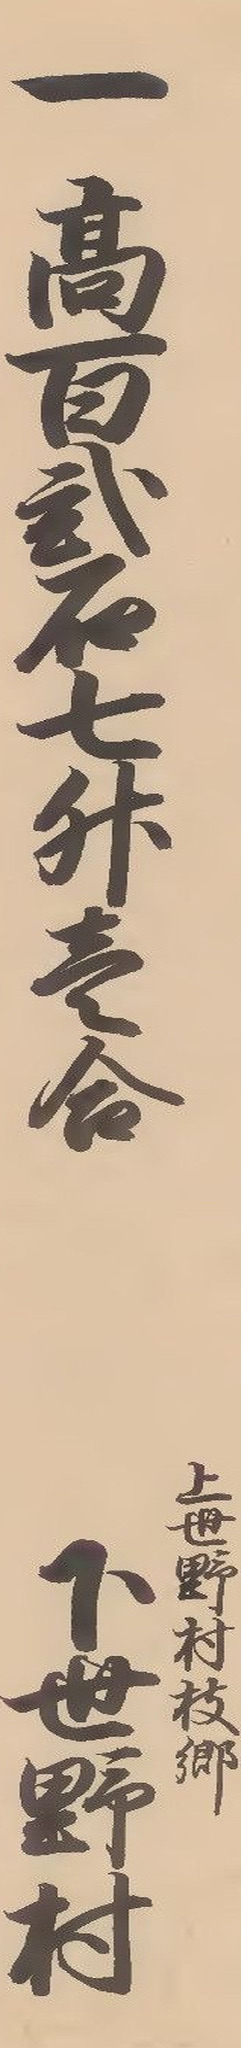一高百弐石七斗壱合下世野村
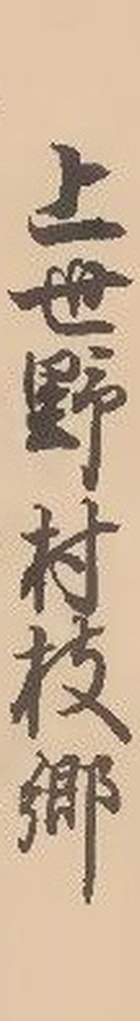上世野村枝郷
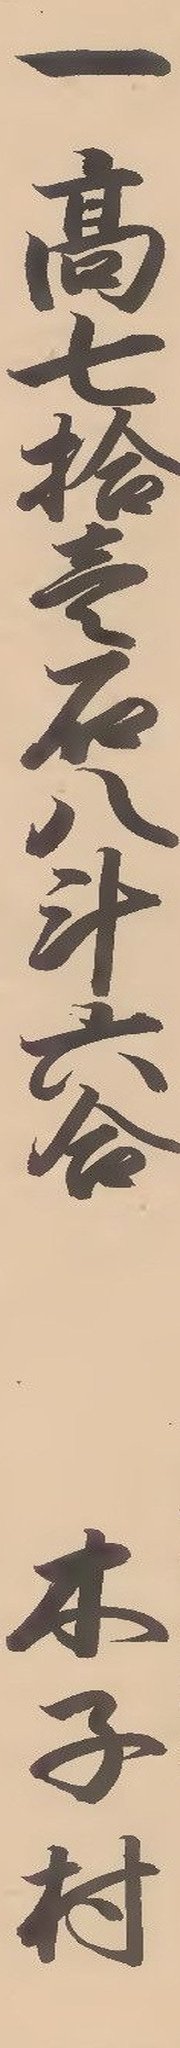一高七拾壱石八斗六合木子村
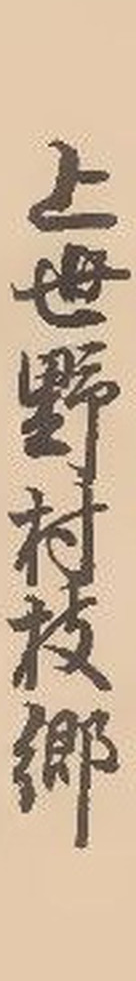上世野村枝郷
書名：丹後国郷帳
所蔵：国立公文書館 National Archives of Japan
